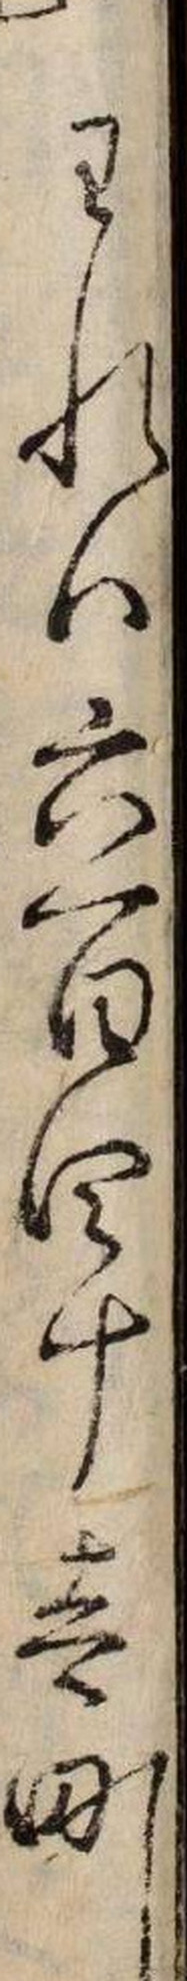われは六百四十壱町
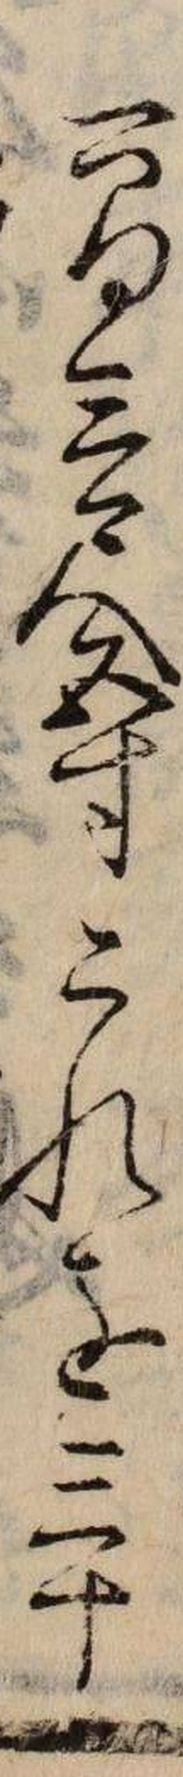一間三尺五寸これを三十
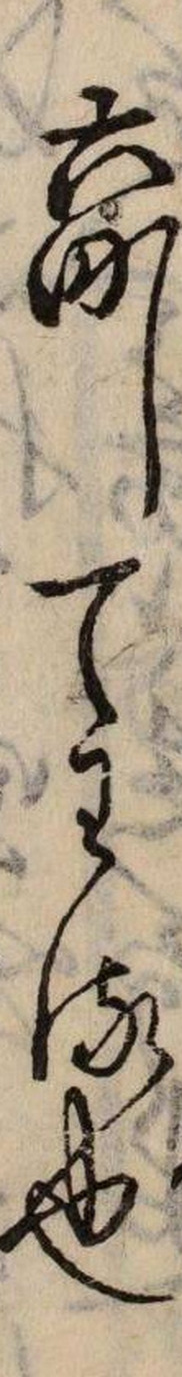六町てわる也

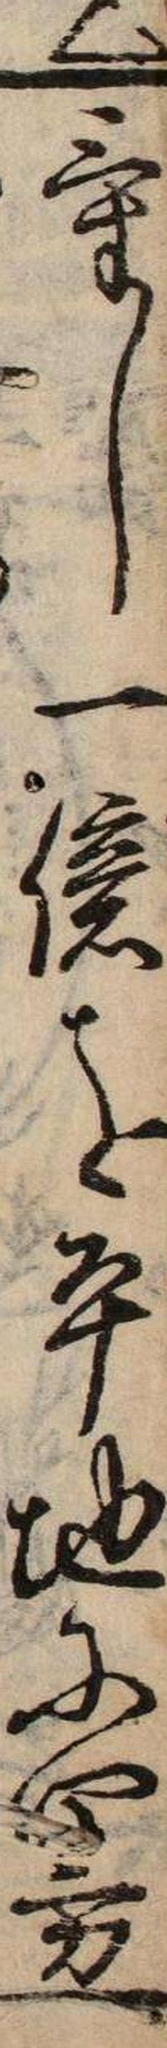△けし一億を平地に四方
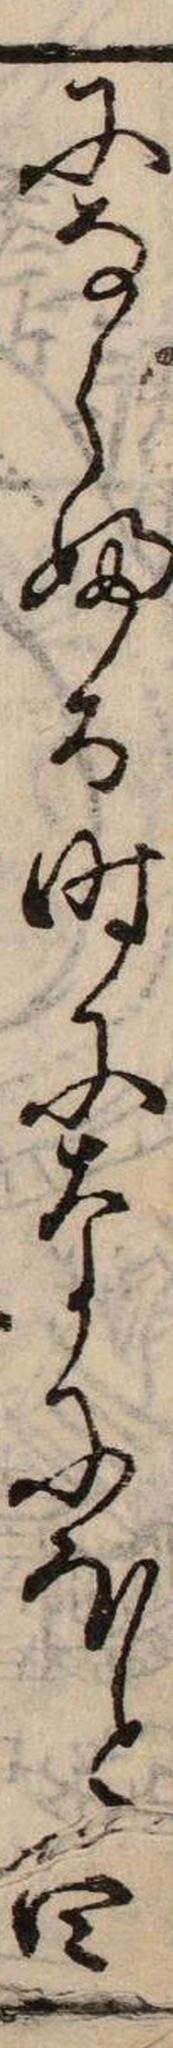にならふる時になにほと四
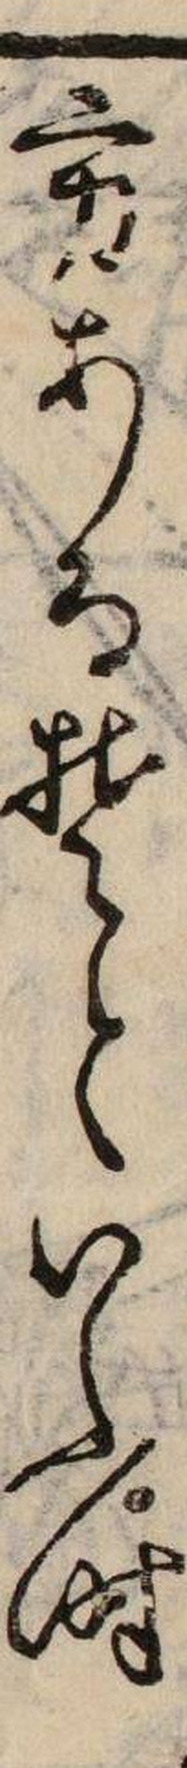方あるそといふ時
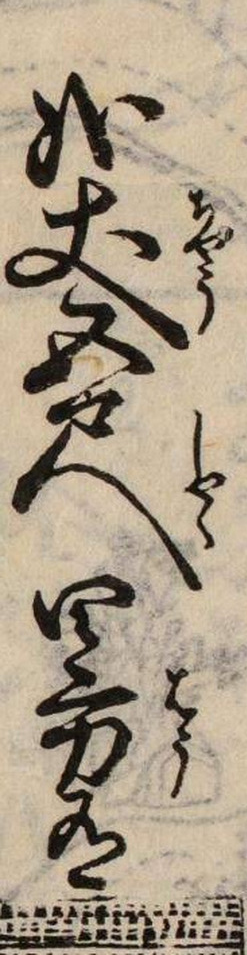弐丈五尺四方有
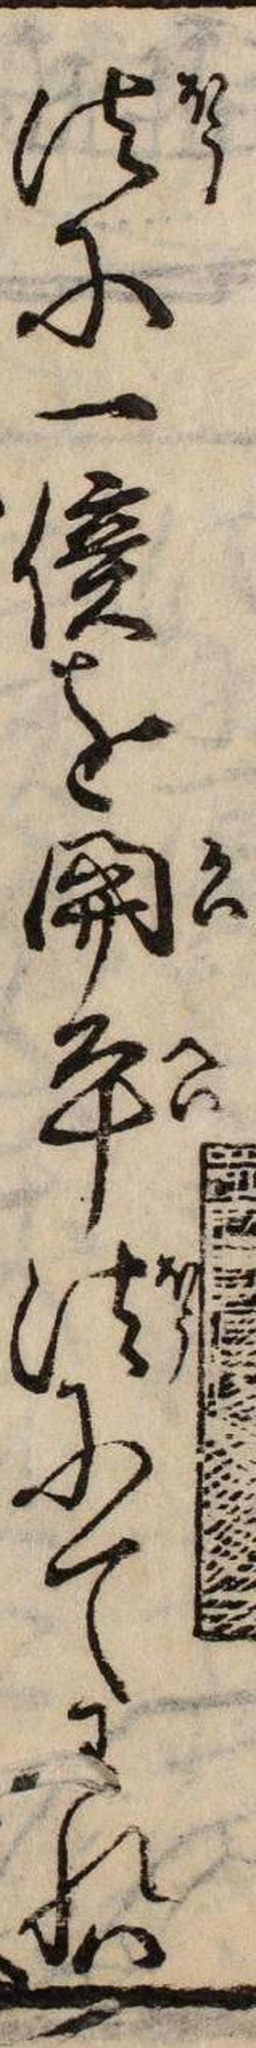法に一億を開平法にてわれは
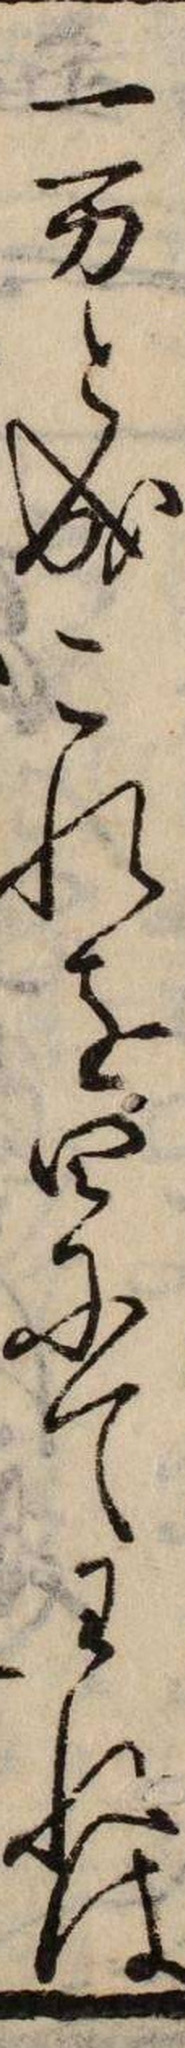一万と成これを四にてわれは
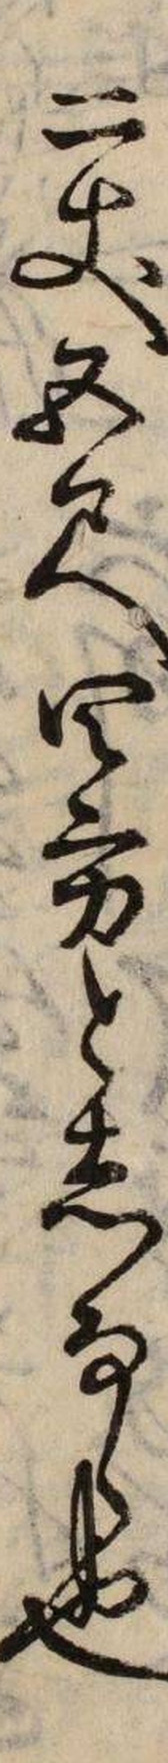二丈五尺四方としるし也
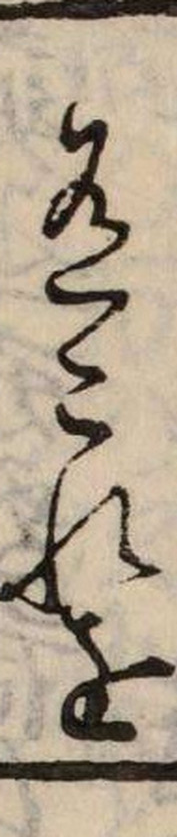有これを
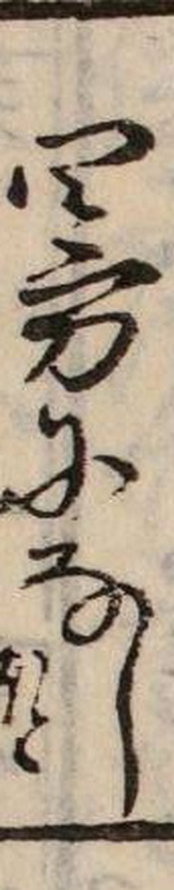四方になし
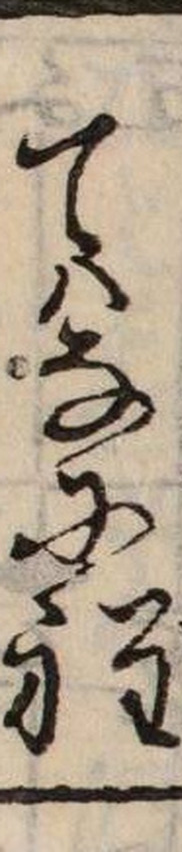てはなに程

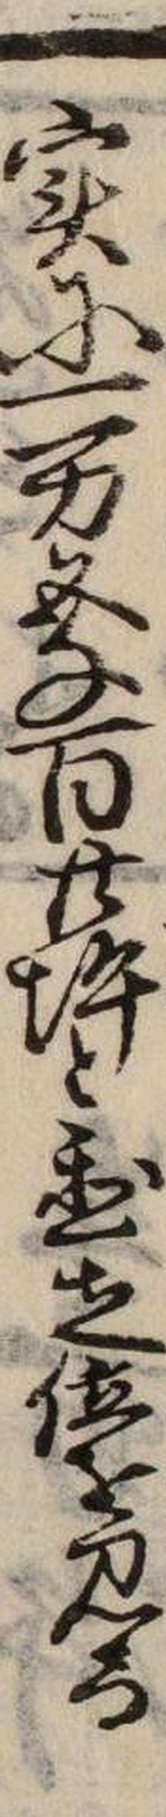実に一万五千百廿坪と置先位を見る
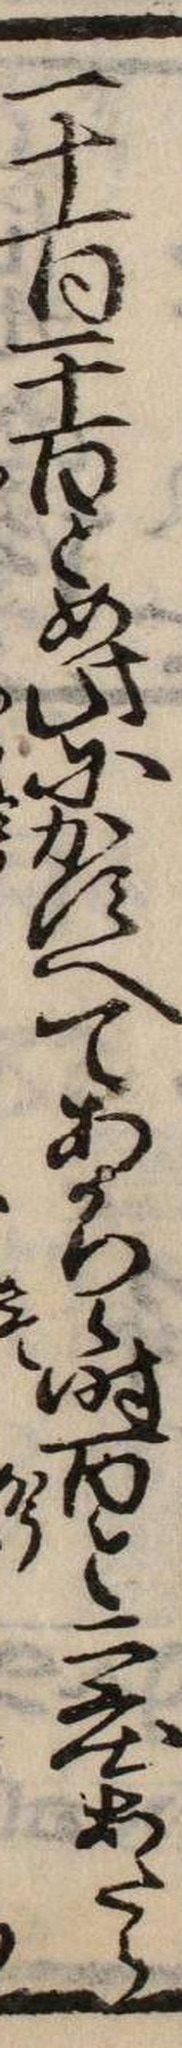一十百一十百とめ此にかすへてあかり時百を二度あたら
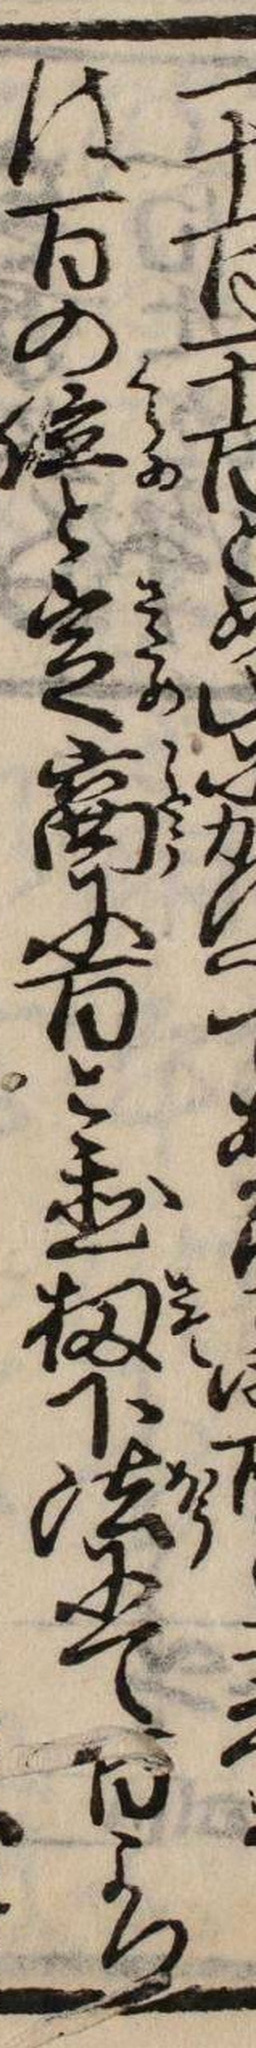は百の位と定商に百を置扨下法にて百より
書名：塵劫記（寛永11年自跋、京都府立京都学・歴彩館追貴8）
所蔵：京都府立京都学・歴彩館 国文学研究資料館
